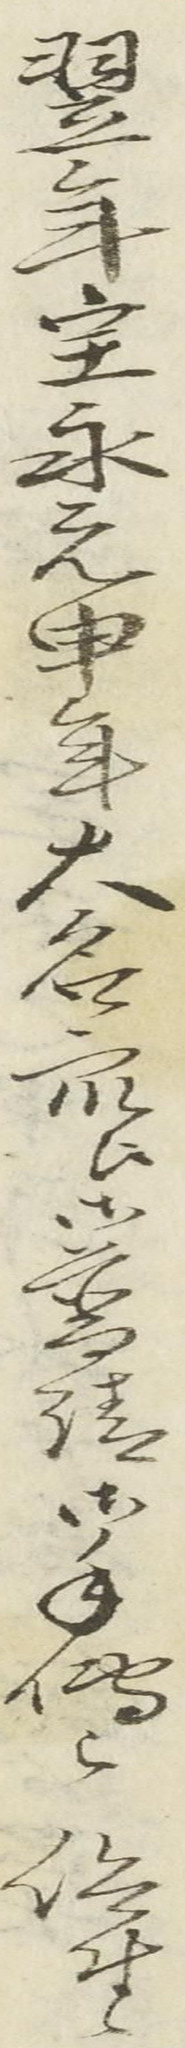翌年宝永元申年大名衆え御普請御手伝被仰付候
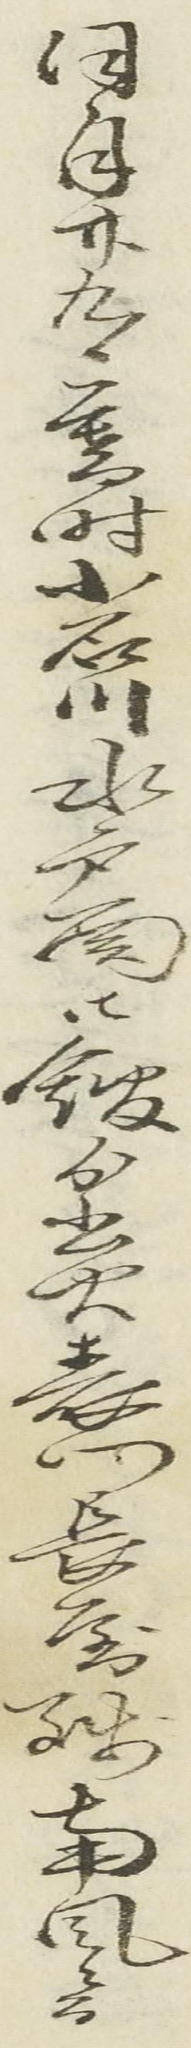同月廿九日暮時小石川水戸殿御館ゟ出火表門長屋残南風ニ而
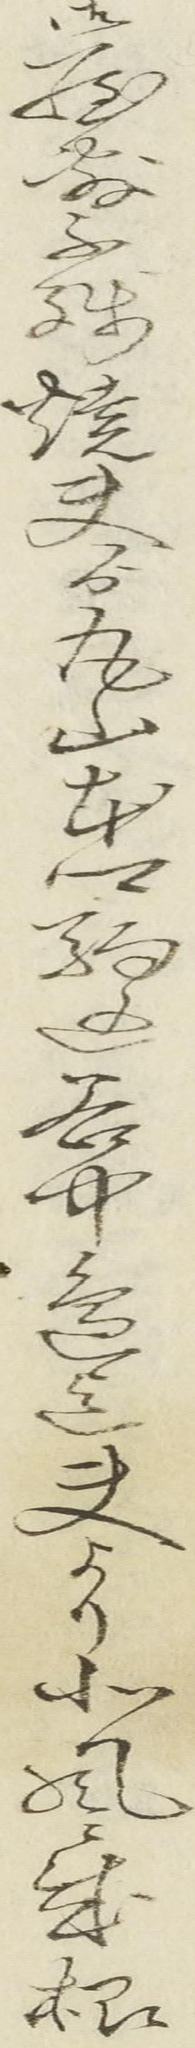御屋敷不残焼失ゟ丸山本郷駒込谷中辺迄夫より北風ニ成根
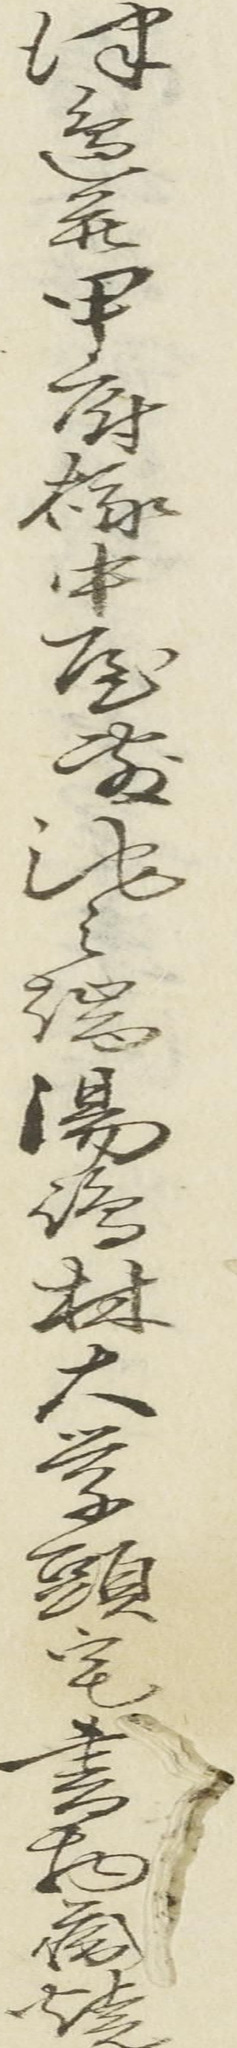津辺幷甲府様中屋敷池之端湯嶋林大学頭宅書物蔵焼
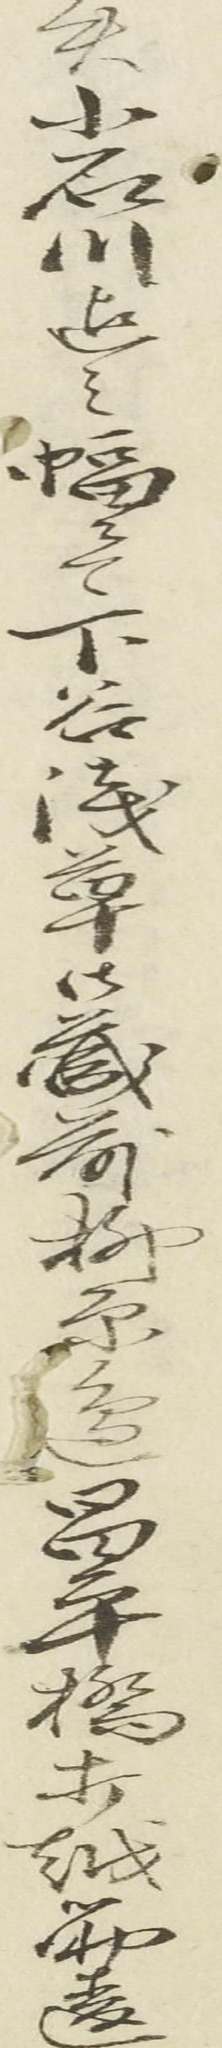失小石川迄之幅ニて下谷浅草御蔵前柳原辺昌平橋打越筋違
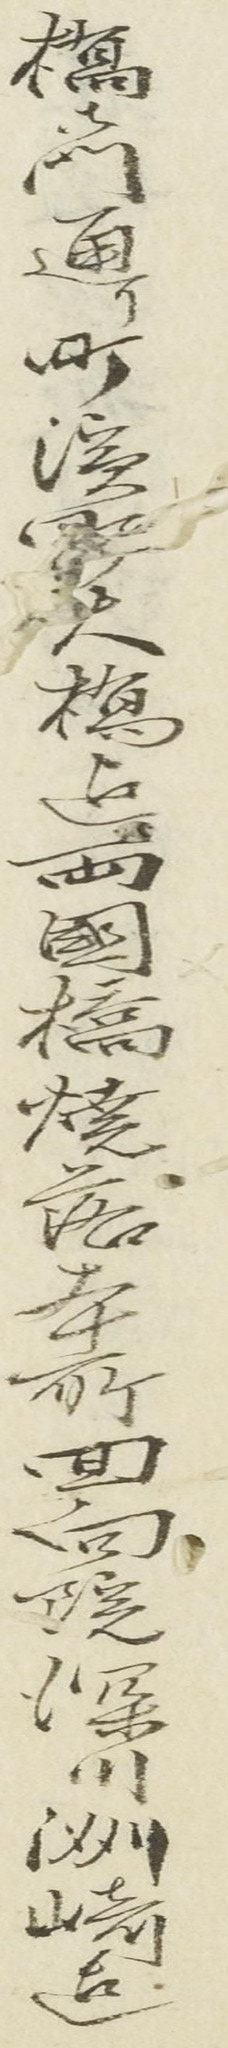橋御門通り町浜橋迄両國橋焼落本所回向院深川洲崎迄
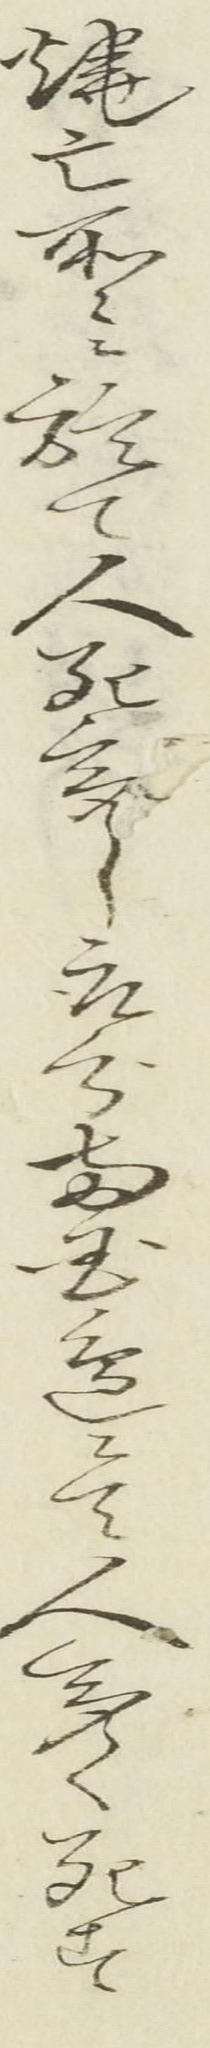焼亡所々ニ於て人死多し取分両國辺ニて人多く死す
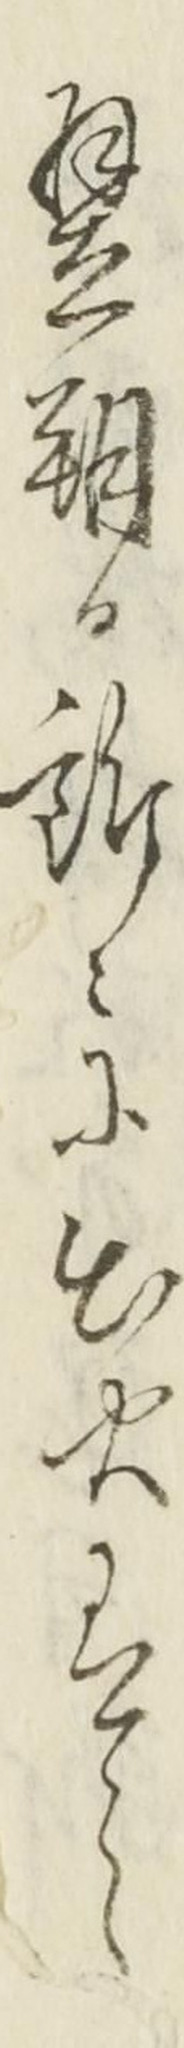翌朔日所々に出火有之
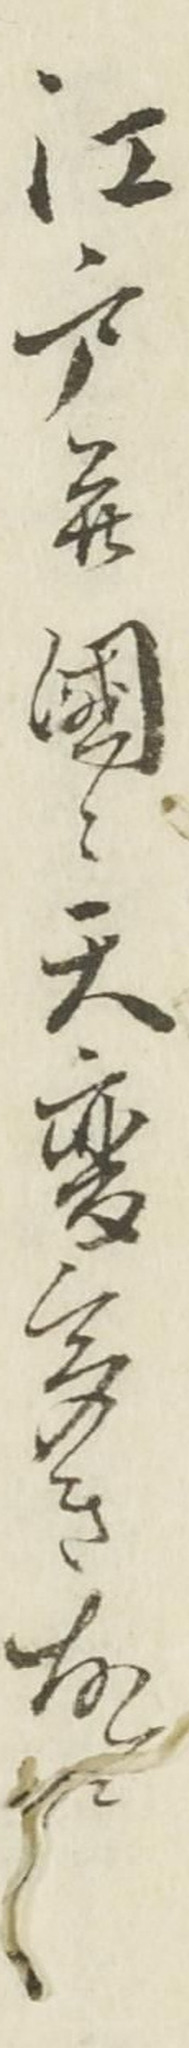江戸幷国々天変多き故ニ
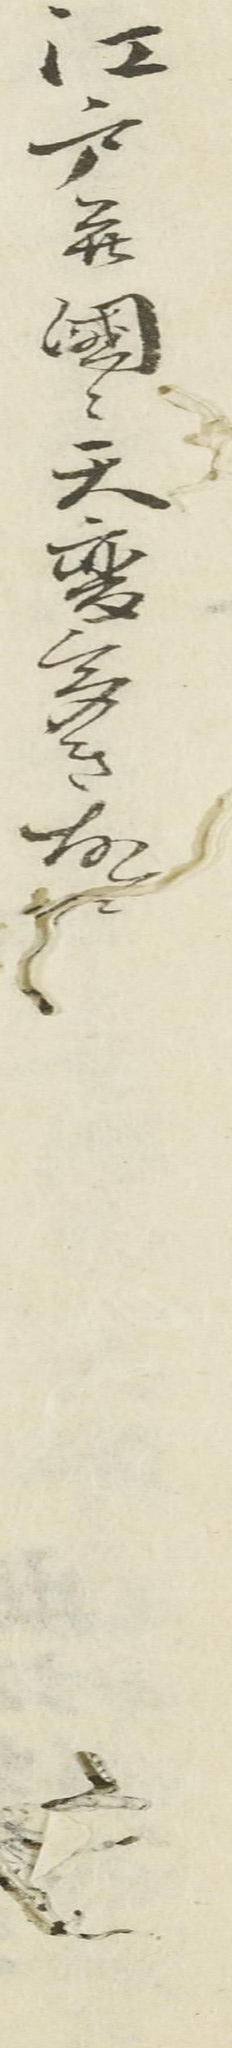江戸幷国々天変多き故ニ
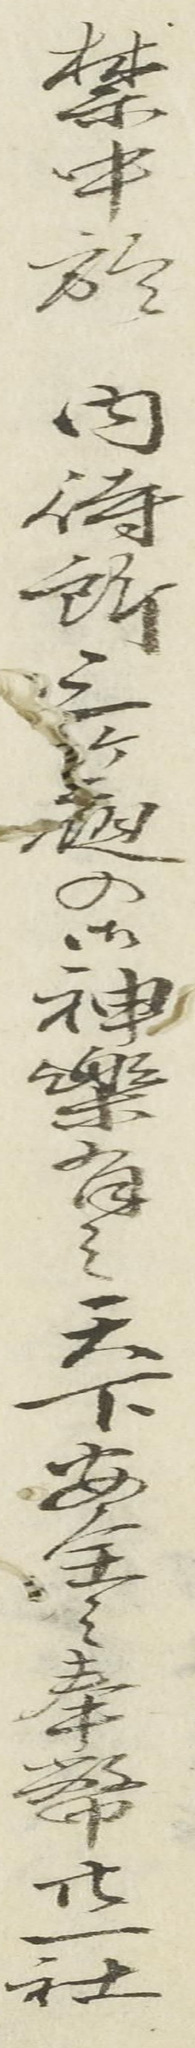禁中於内侍所三ケ夜の御神楽有之天下安全之奉幣廿一社
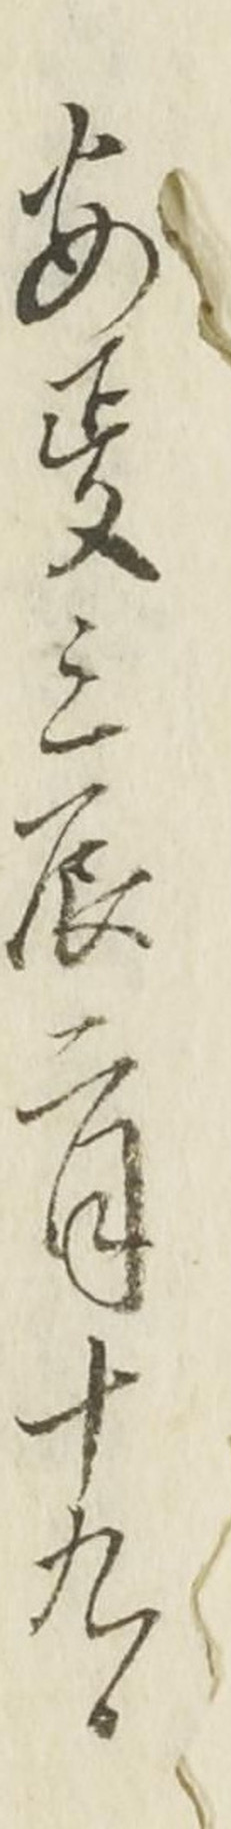安政三辰二月十九日
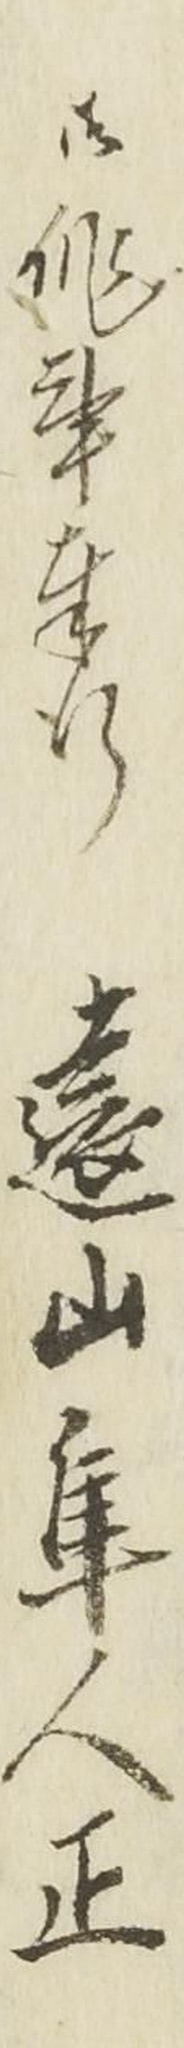御作事奉行遠山隼人正
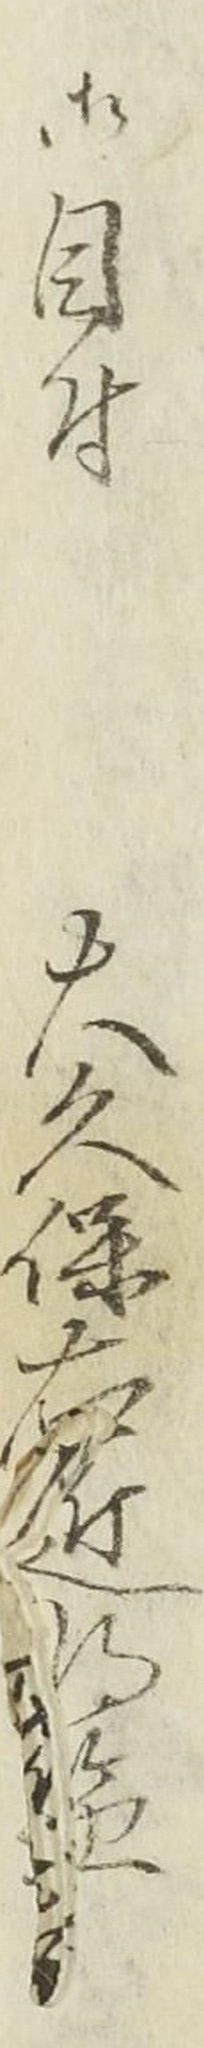御目付大久保右近将監
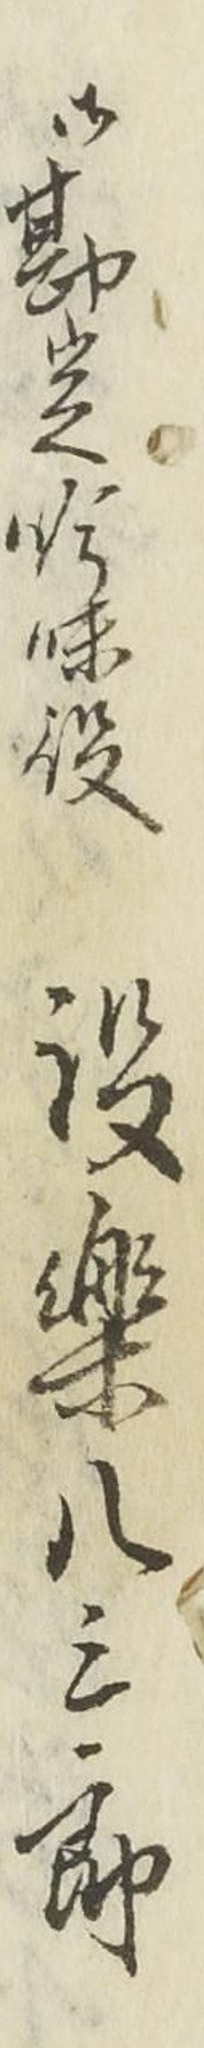御勘定吟味役設楽八三郎
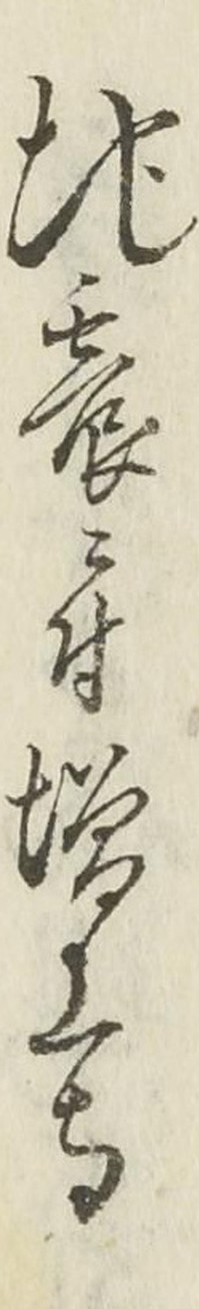地震ニ付増上寺
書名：安政二乙卯年十月二日大地震之事
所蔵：東京大学地震研究所図書室 Earthquake Research Institute Library, The University of Tokyo, JAPAN
